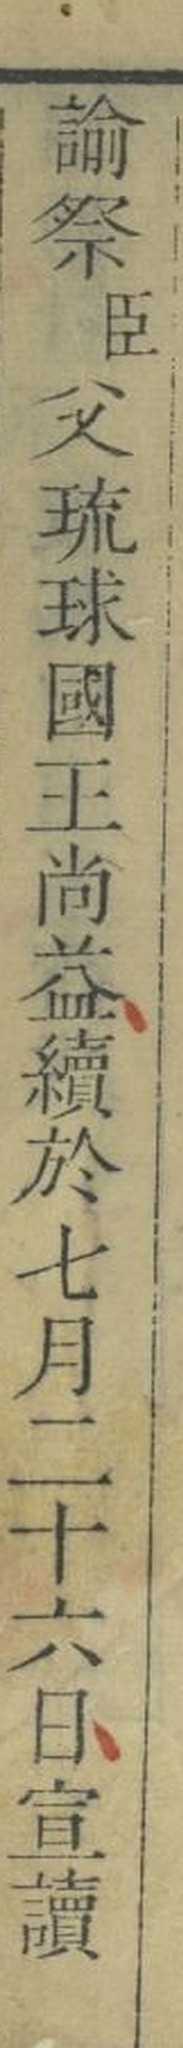諭祭臣父琉球國王尚益續於七月二十六日宣讀

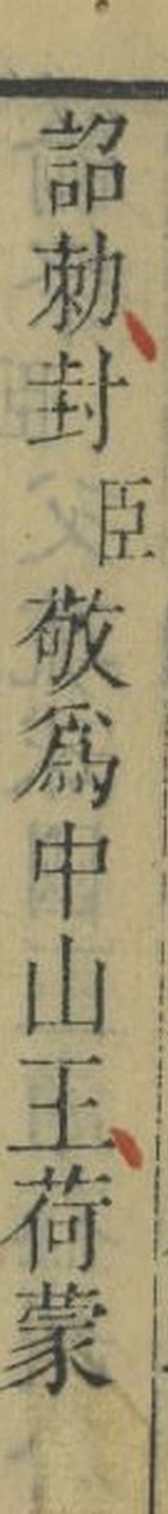詔勅封臣敬爲中山王荷蒙
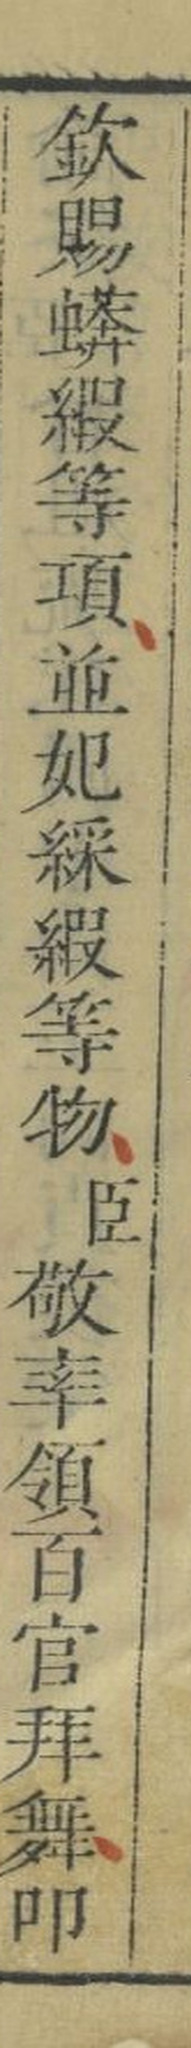欽賜蠎縀等項並妃綵縀等物臣敬率領百官拜舞叩
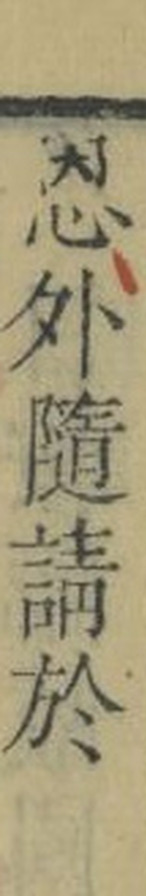恩外隨請於
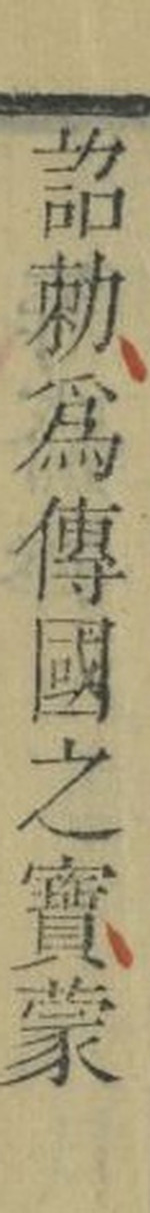詔勅爲傳國之寶蒙
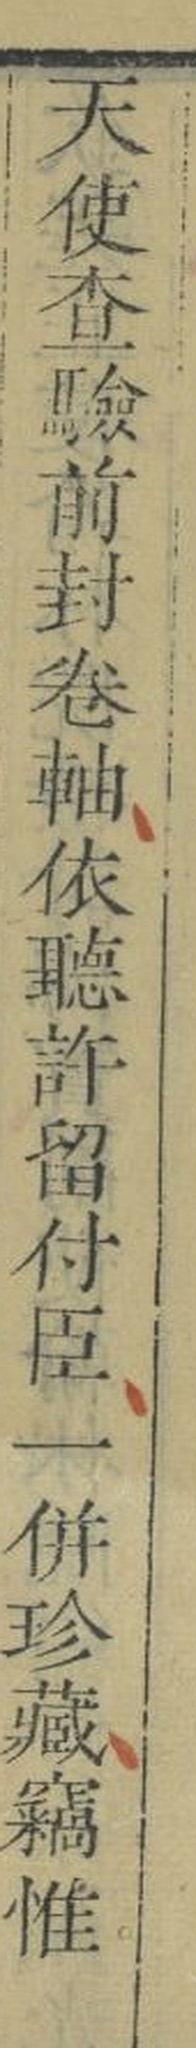天使査驗前封卷軸依聽許留付臣一併珍藏竊惟
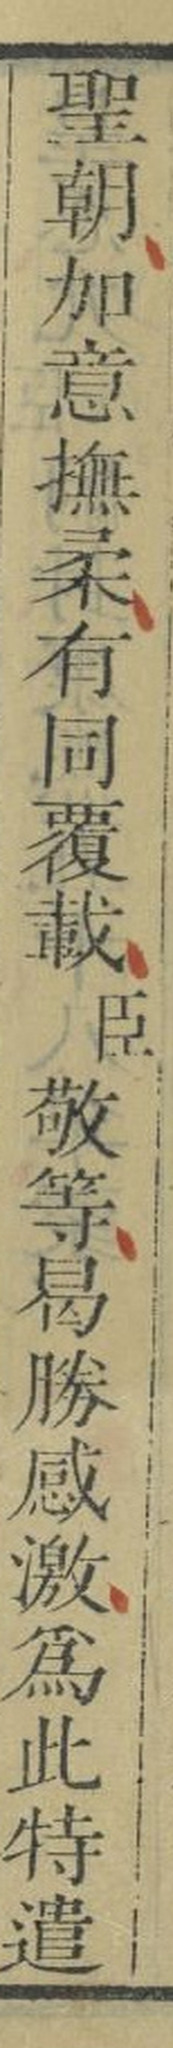聖朝加意撫柔有同覆載臣敬等曷勝感激爲此特遣
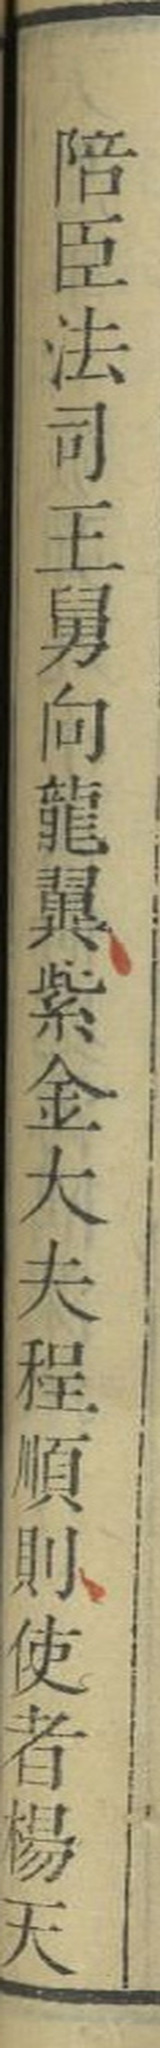陪臣法司王舅向龍翼紫金大夫程順則使者楊天
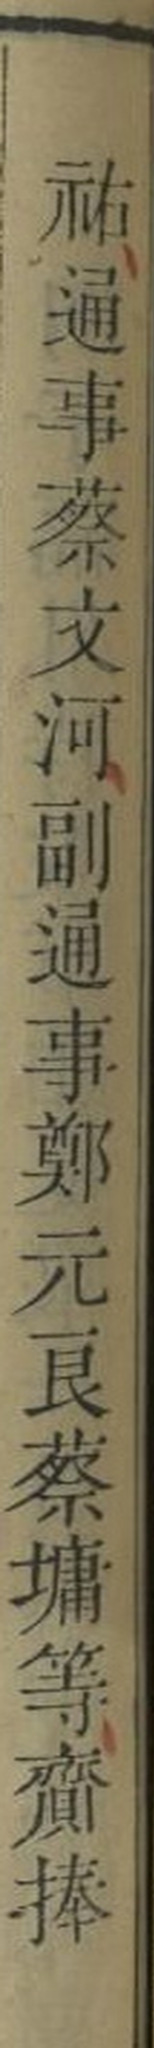祐通事蔡文河副通事鄭元良蔡墉等齎捧
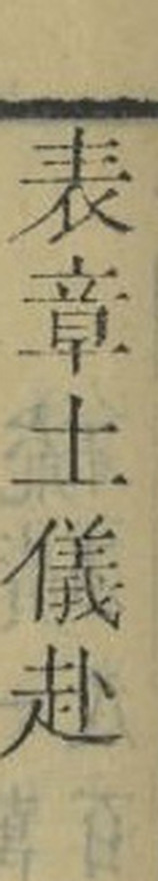表章土儀赴
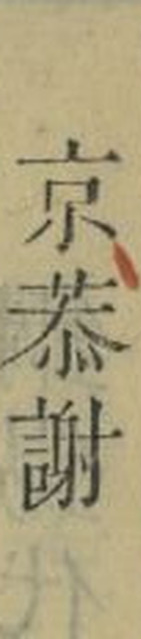京恭謝
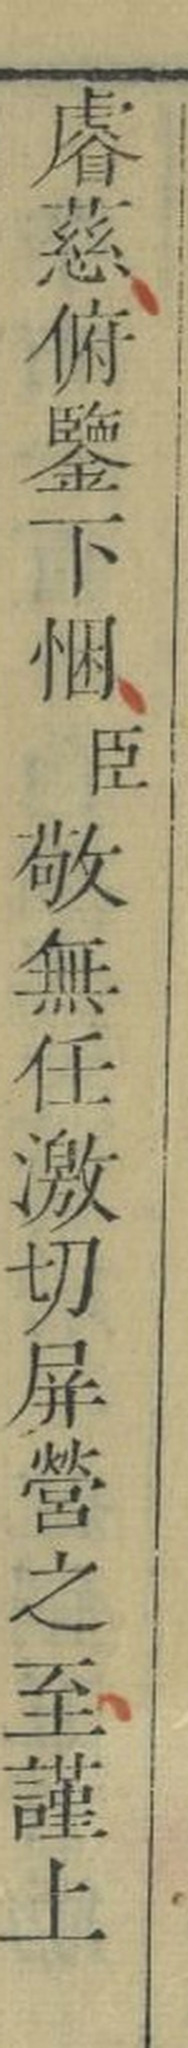睿慈俯鑒下悃臣敬無任激切屏營之至謹上

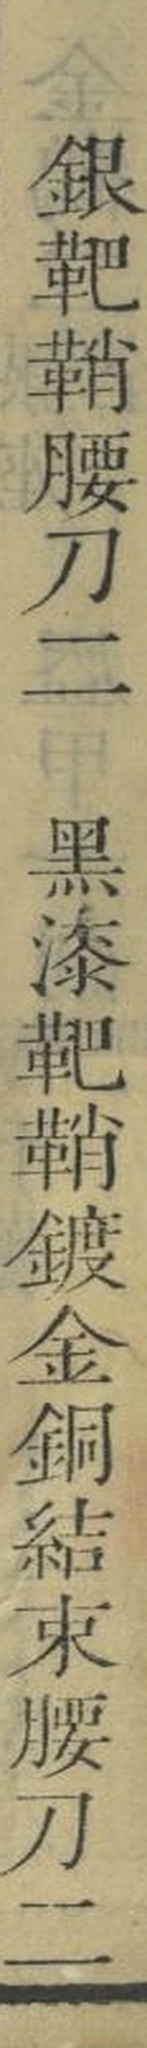銀靶鞘腰刀二黑漆靶鞘鍍金銅結束腰刀二
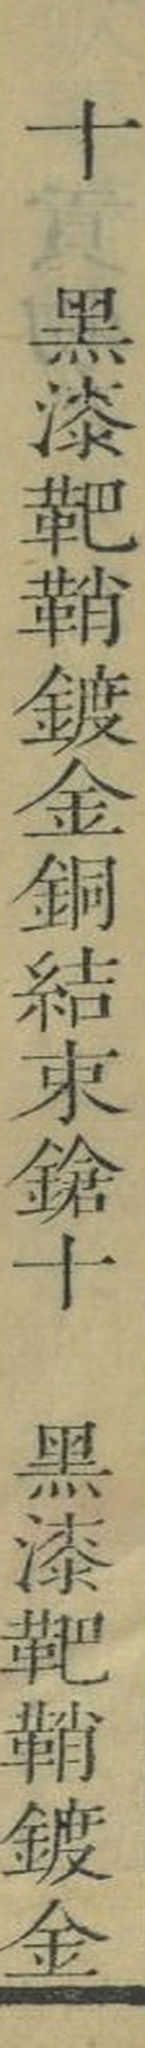十黑漆靶鞘鍍金銅結束鎗十黑漆靶鞘鍍金
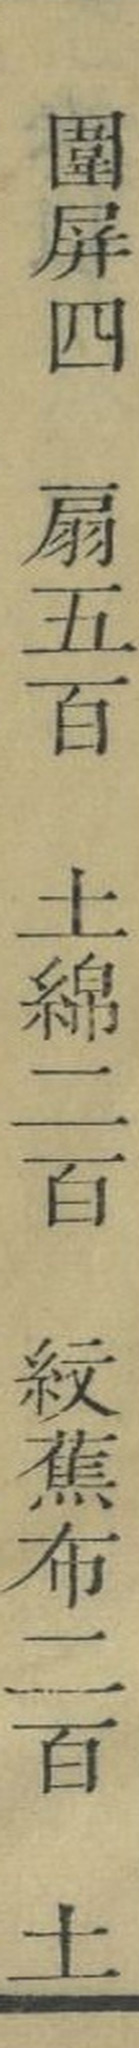圍屏四扇五百土綿二百紋蕉布二百土
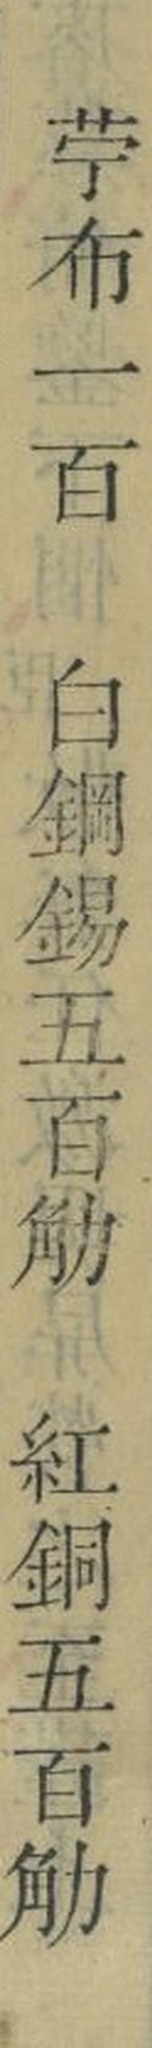苧布一百白鋼錫五百觔紅銅五百觔
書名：中山伝信録 巻一、巻二
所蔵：University of the Ryukyus Library
